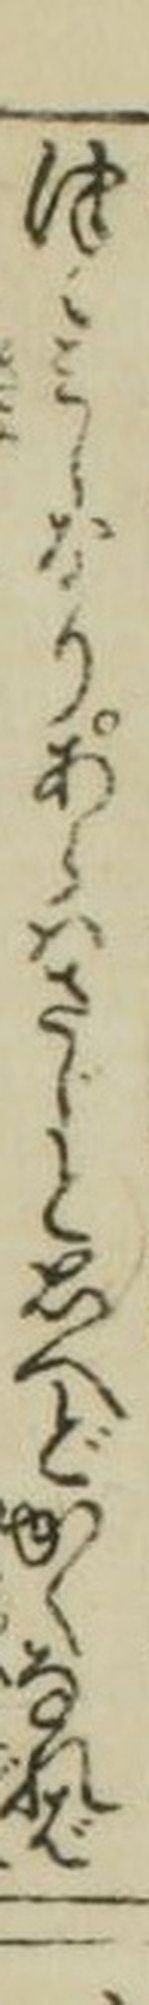つゝみしなり。あらはさじと思へどかくなれば
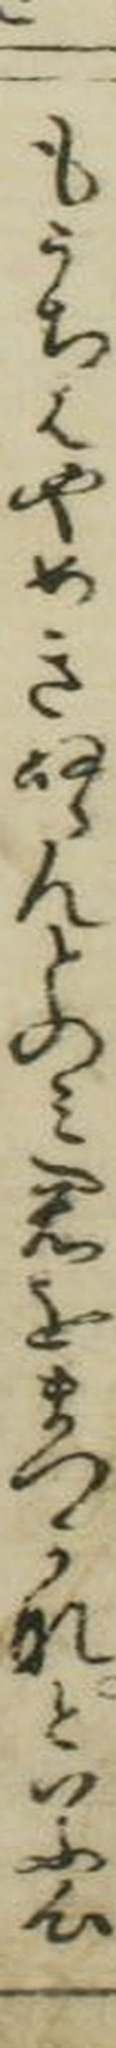もうちはやめきぬらんとのみ君をまつかな。といふ心
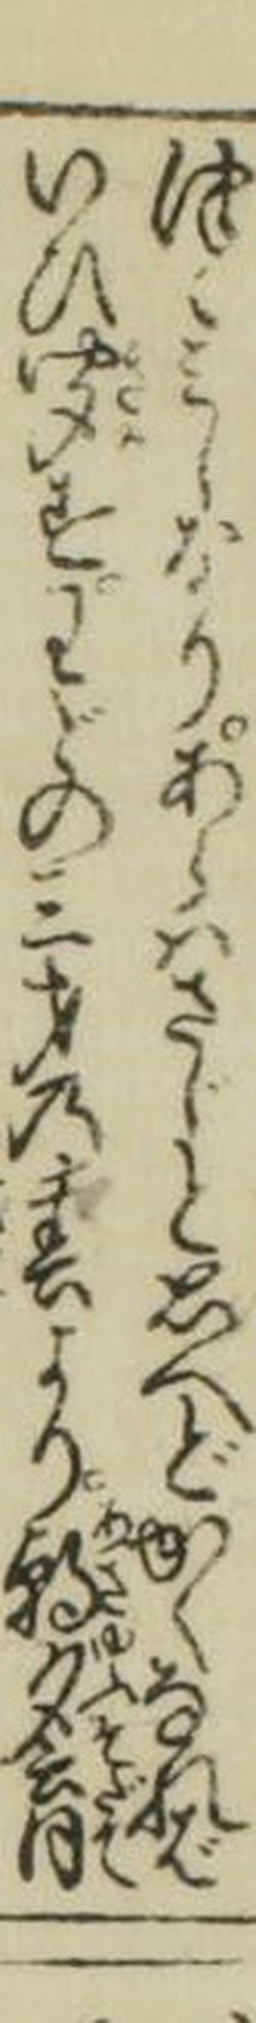いひ聞す。わどの三才の春より。朝夕育
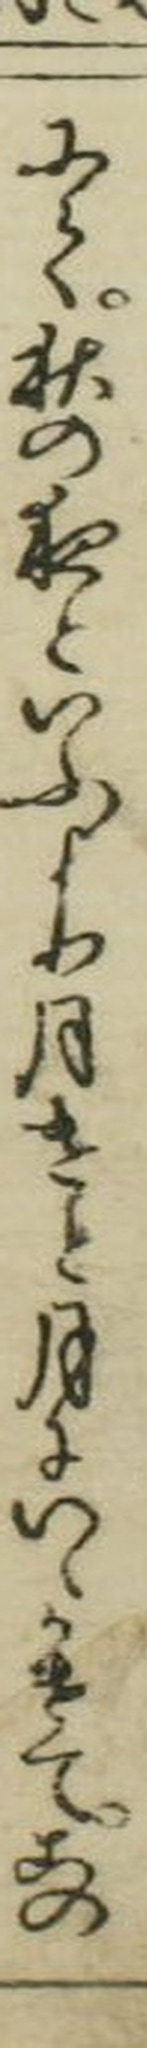にて。秋の夜といふより月けと月にいゝかけて。この
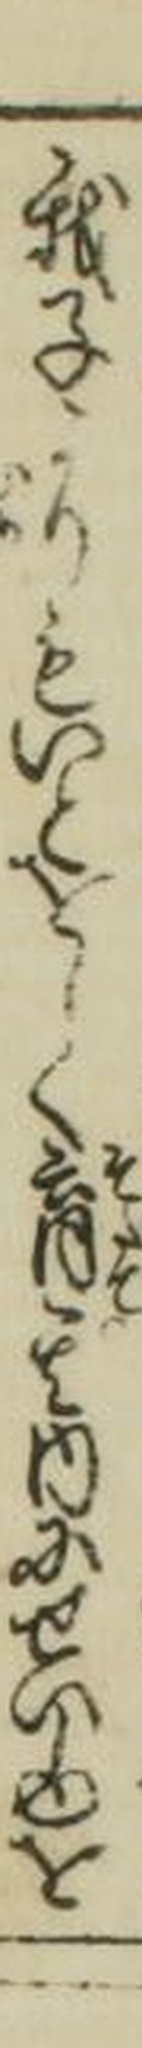我子よりもいとをしく育其内にせいしゆを
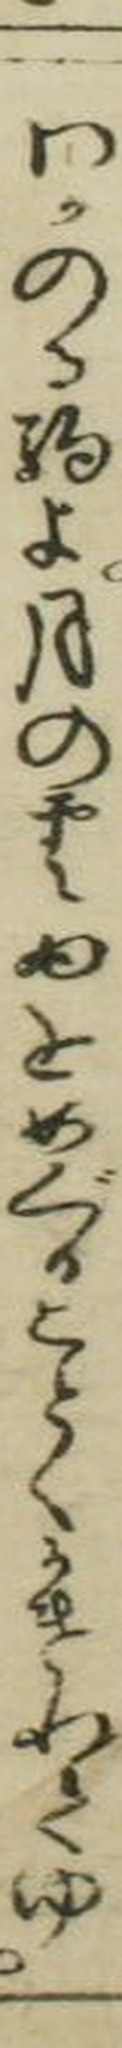わかのる駒よ。月の雲ゐをめぐることくかけりてゆ
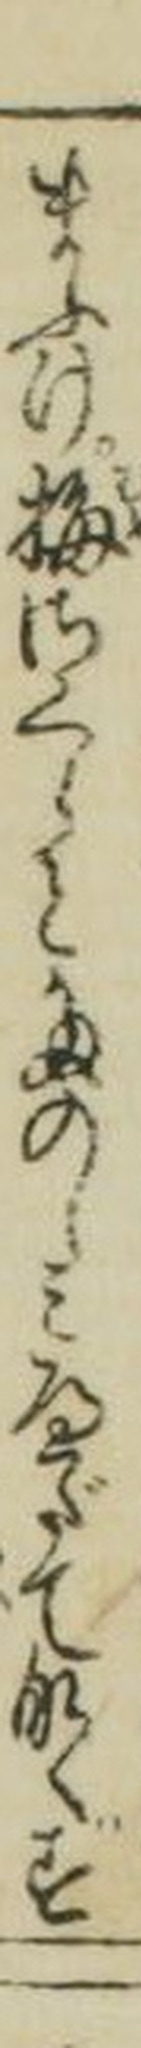まふけ。梅さくらとたのしみへだてなく。す
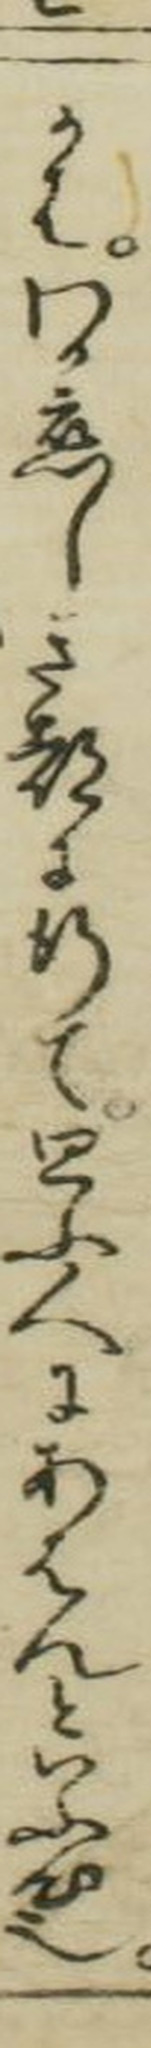かは。わか恋しき都に行て。思ふ人にあはんといふ心也。
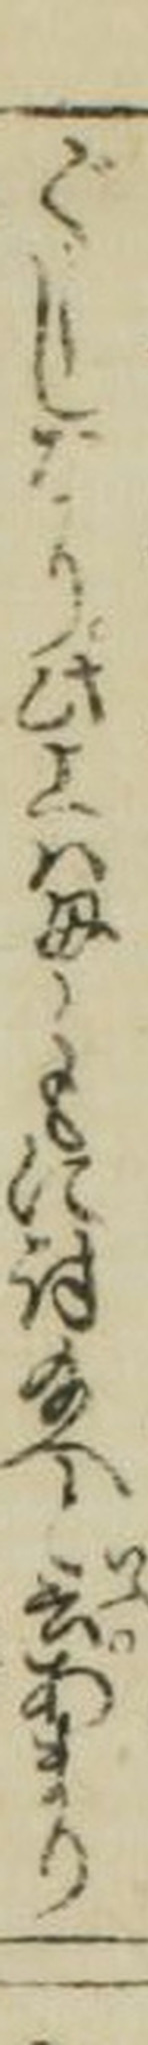ぐししなり。此上は母ともに討給へと云。あまり
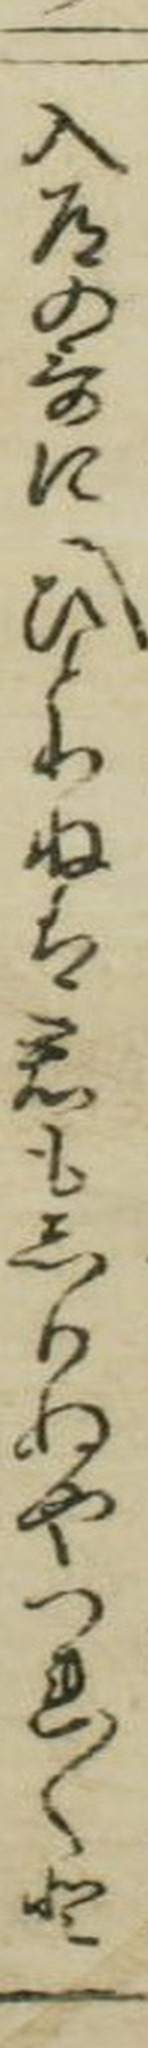入道の哥に〽ひとりねは君もしりぬやつれ〳〵と
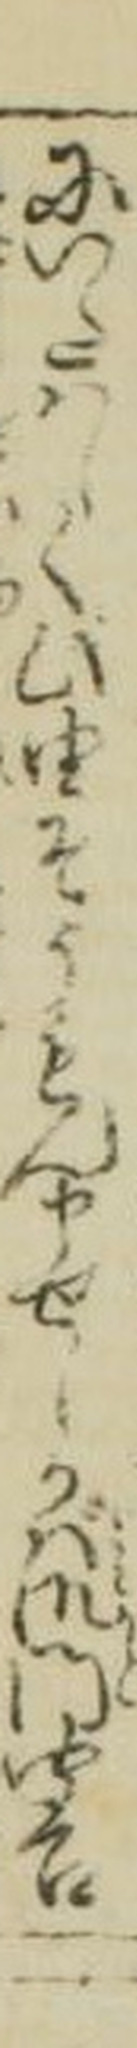にいたはしく。此由そうもん申せしかば御門聞召
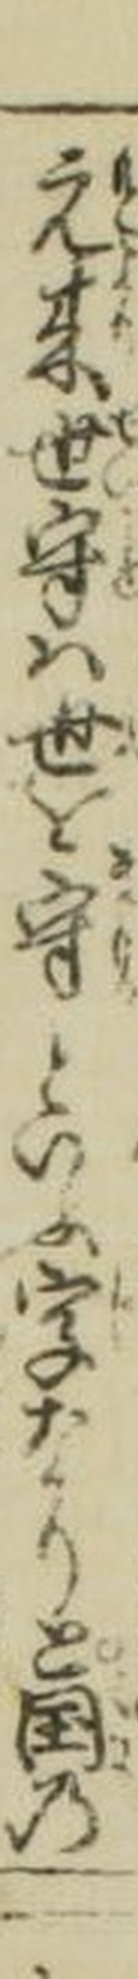元来世守は世を守といふ字なりと。国の
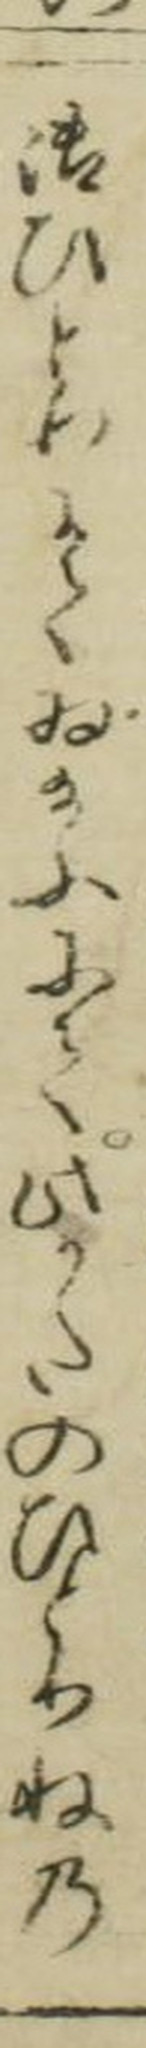御ひとりにてゐ給ふにて。此かたのひとりねの
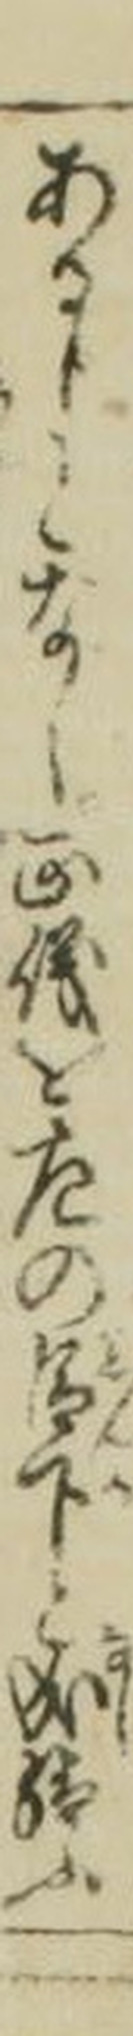あるじとなし。正儀を左の臣下と成給ふ
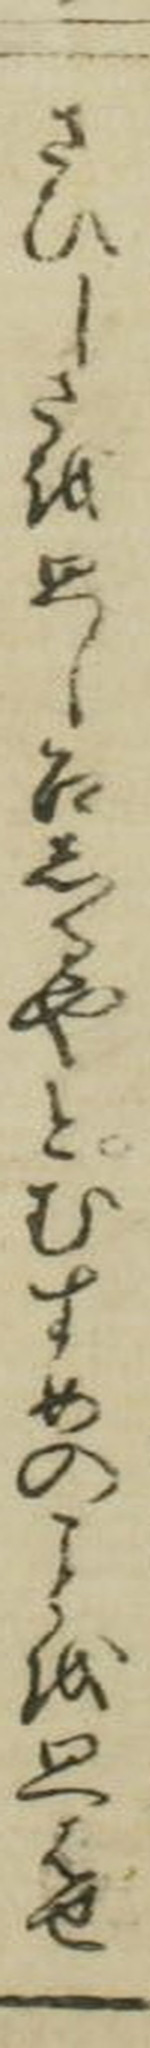さひしさを思し召しるやと。むすめのことを思はせ
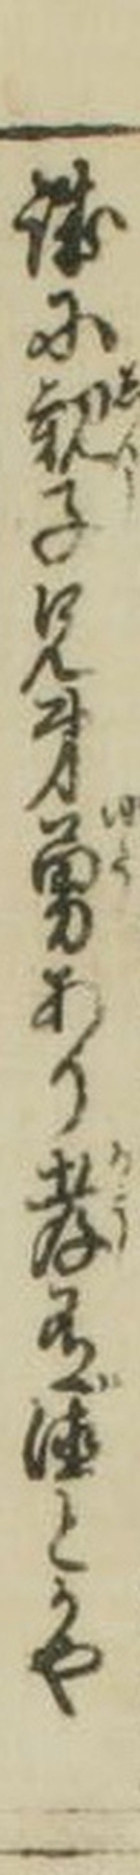誠に親子兄弟勇あり孝有る徳とかや
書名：女源氏教訓鑑
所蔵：東京学芸大学附属図書館
